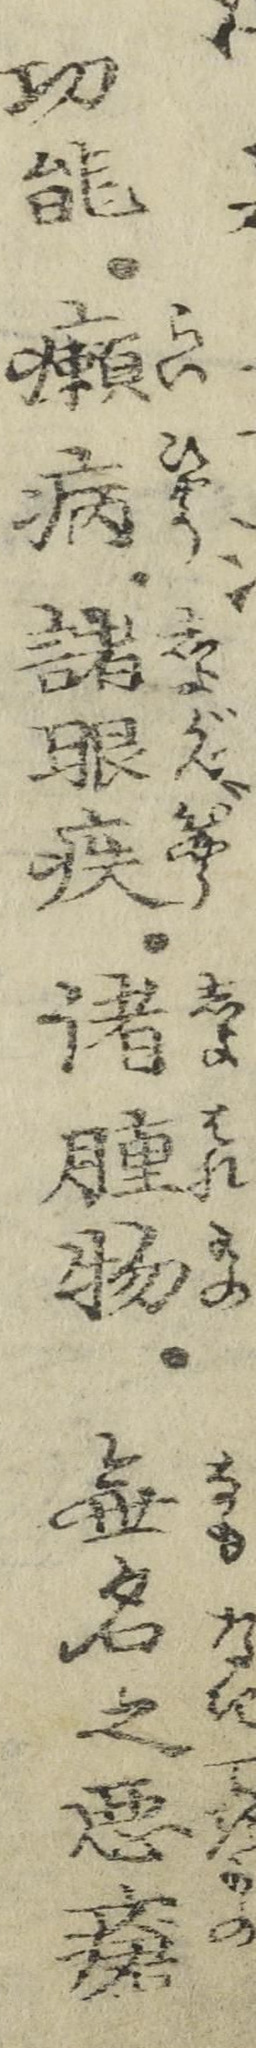効能・癩病・諸眼病・諸腫物・無名之悪瘡
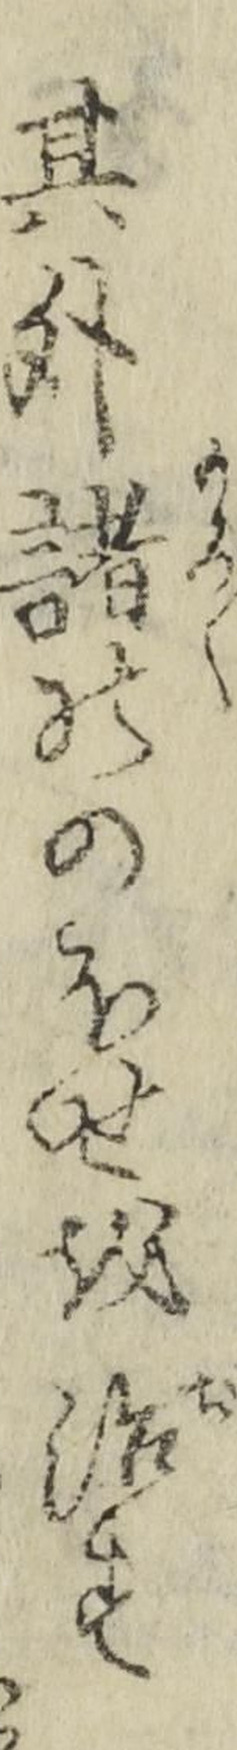其外諸ののほせを治す
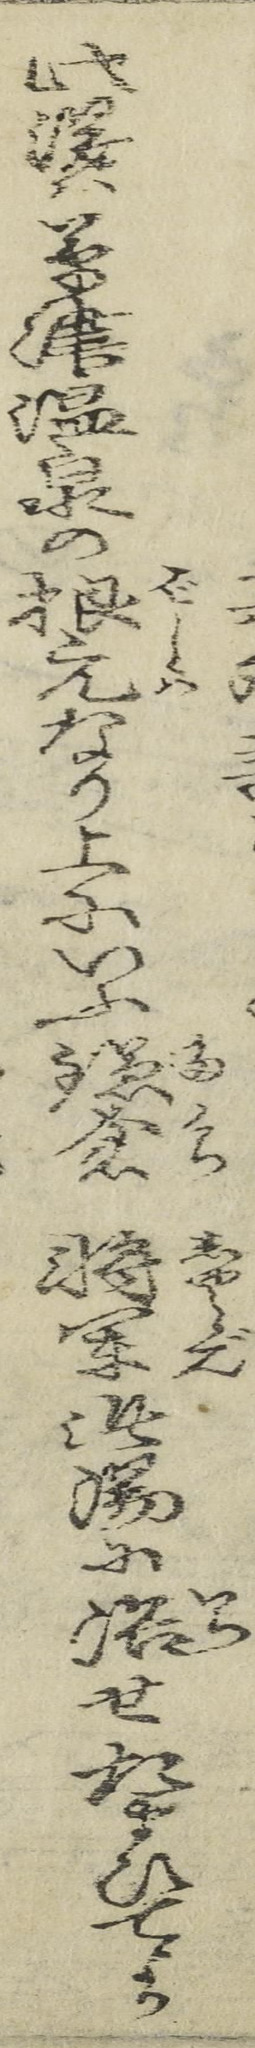此湯は草津温泉の根元なり上にいふ鎌倉将軍の湯に浴せ給ひてより
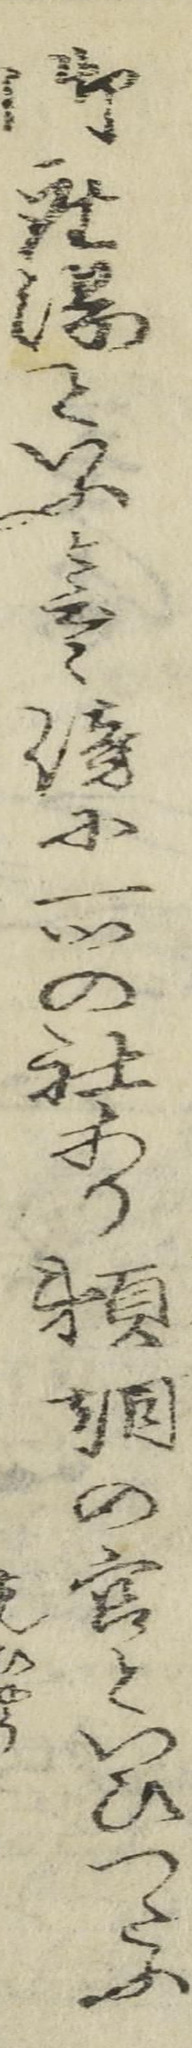御座湯といふと云々傍に一ツの社あり頼朝の宮といひつたふ
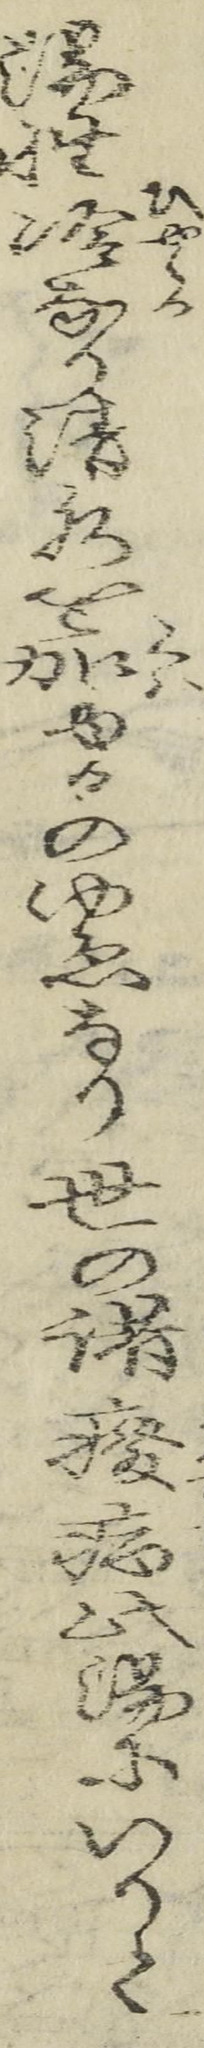湯性冷なり清水を加ゆるのゆゑなり世の諸癈病此湯にいりて
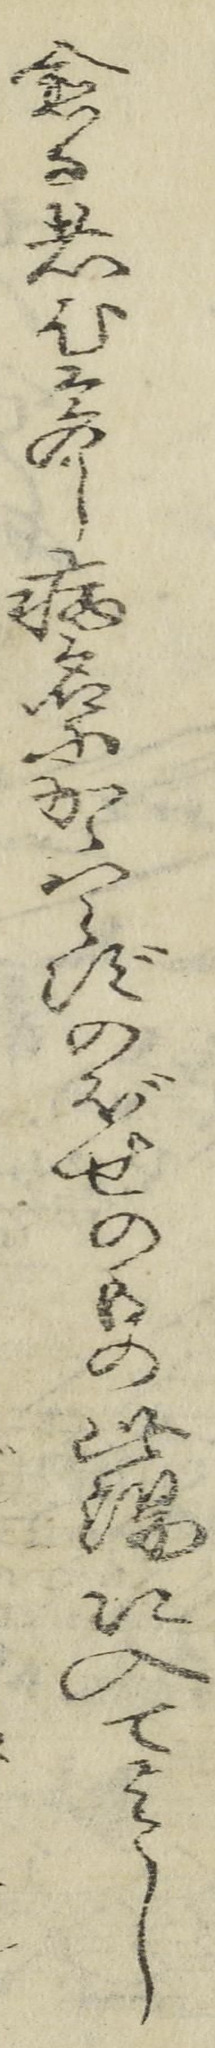癒る者尤多し病名にかゝはらずのぼせのもの此湯に入てよし
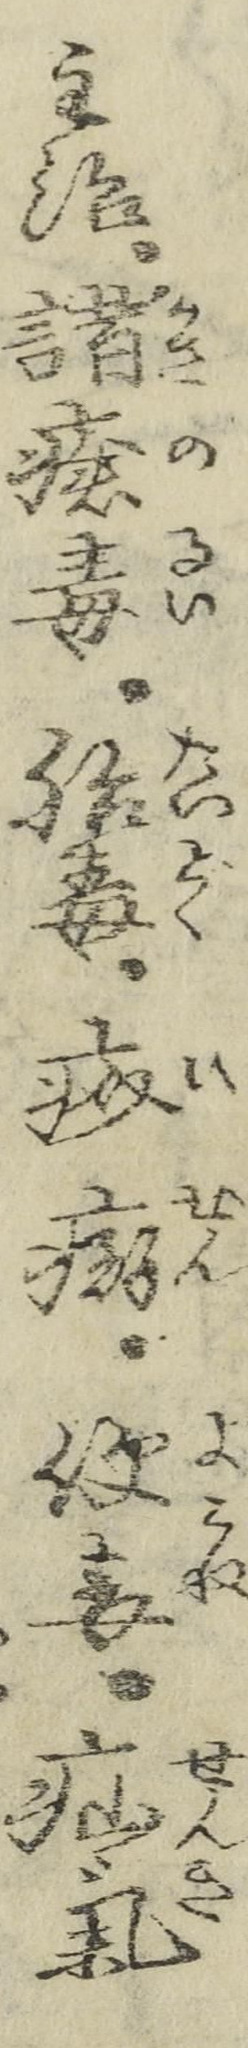主治・諸瘡毒・胎毒・疥癬・便毒・疝気
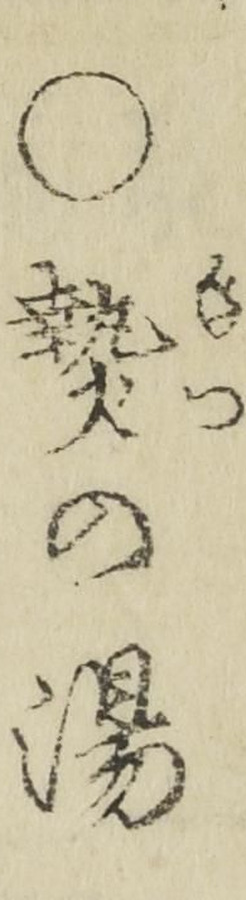◯熱の湯
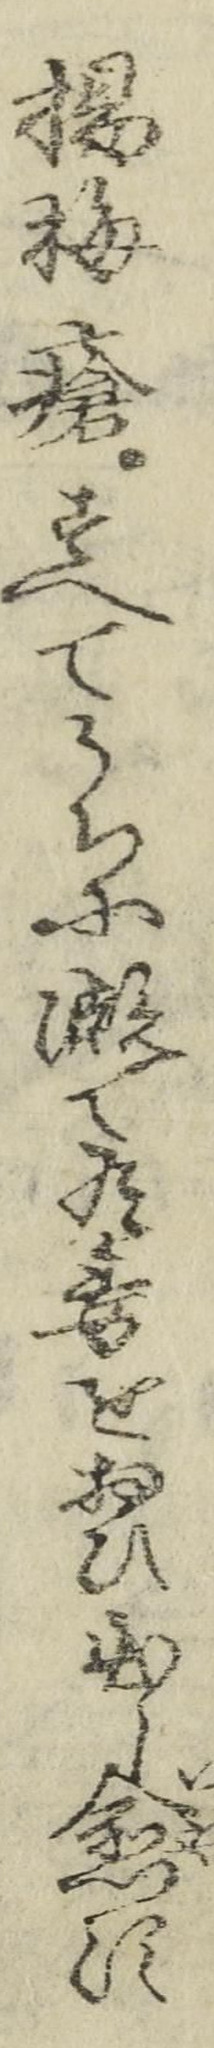揚梅瘡・すへてうちに澱て有毒をおひ出し癒す
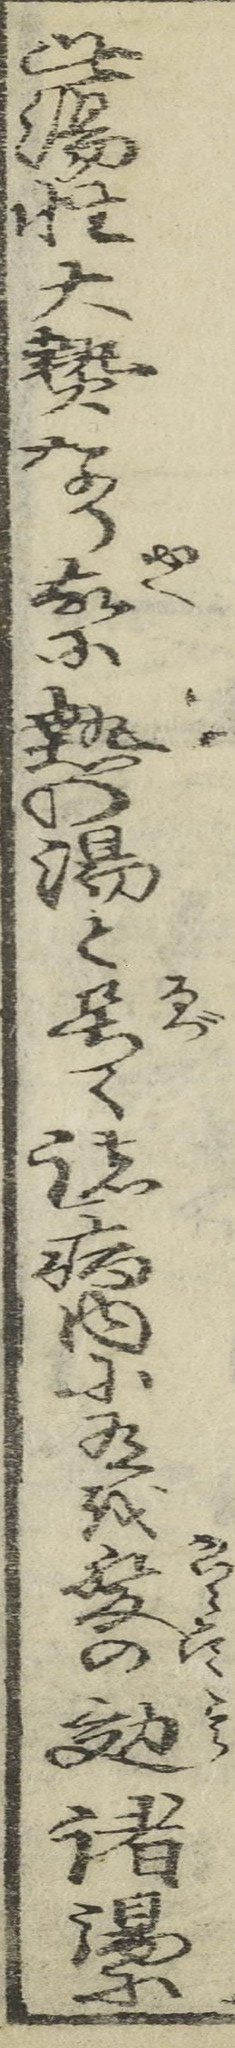此湯性大熱なり故に熱の湯と号く諸病内に有を変の効諸湯に
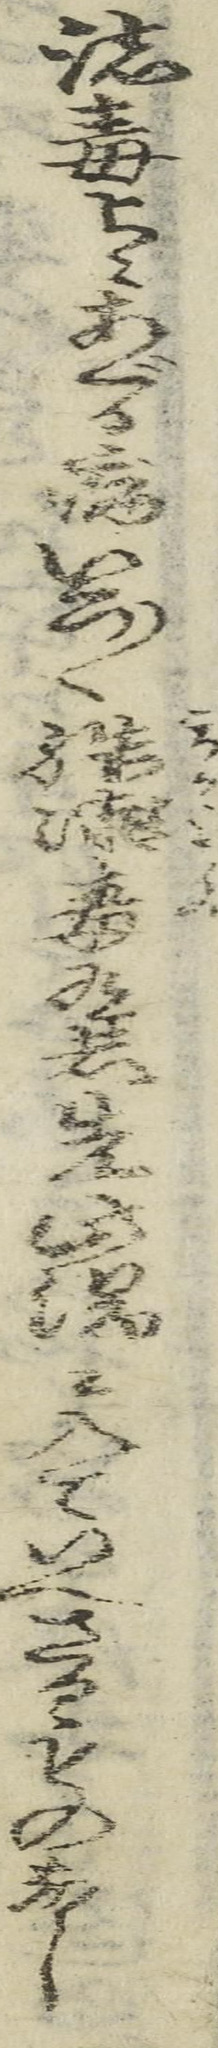諸毒上にあぐる病いろ〳〵㬶澱毒有共先此湯に入ていへさるものなし
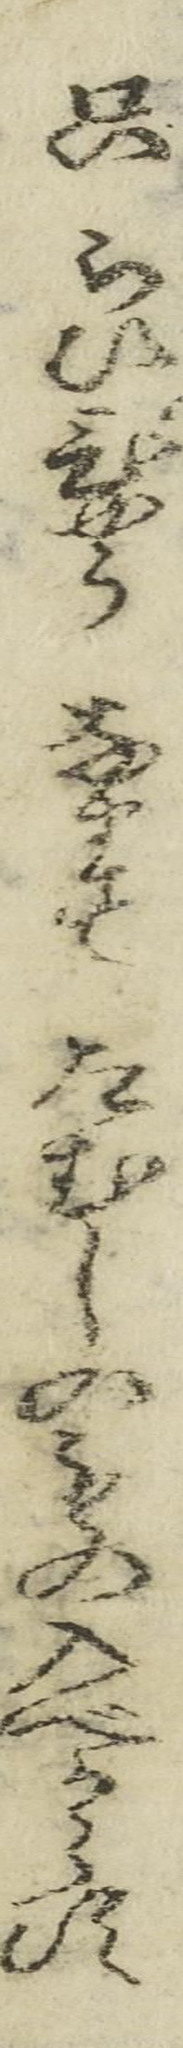只らひびやうなますたむしのもの入べからす
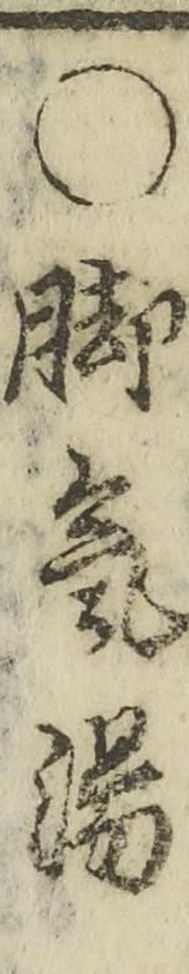◯脚気湯
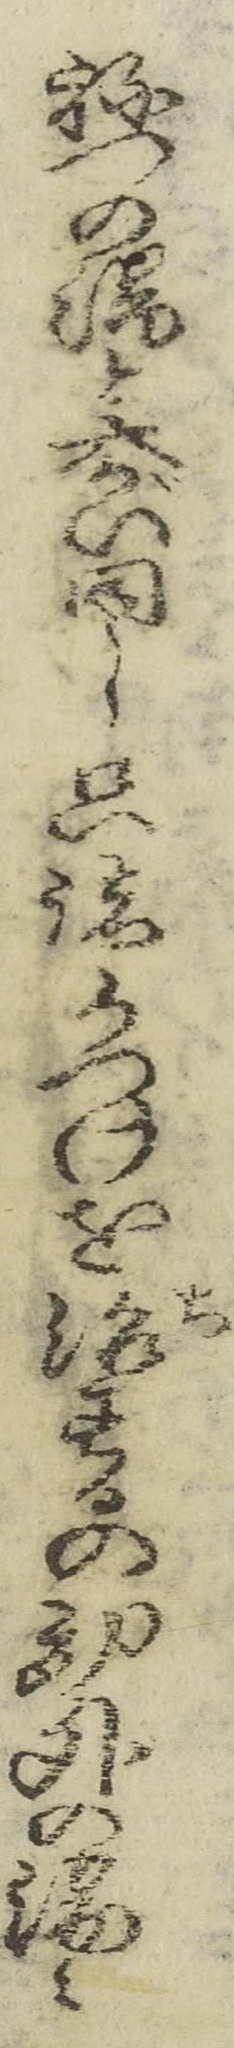ねつの湯と大がい同し只諸かつけを治するの効外の湯に
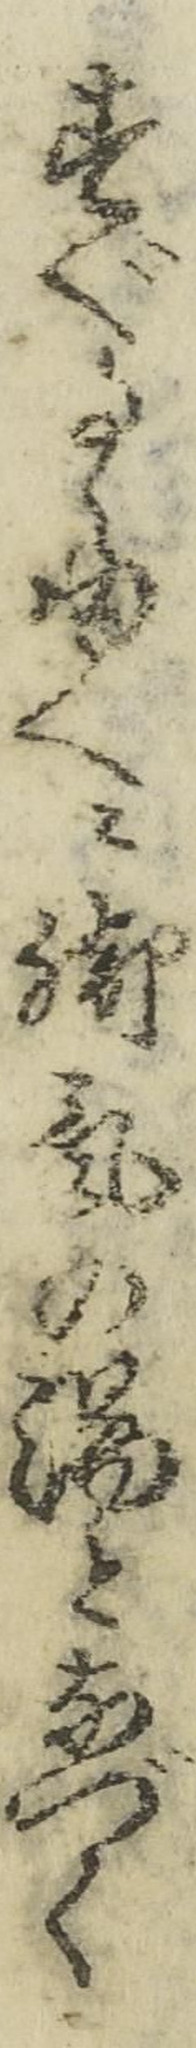すぐるゝゆへに脚気の湯となづく
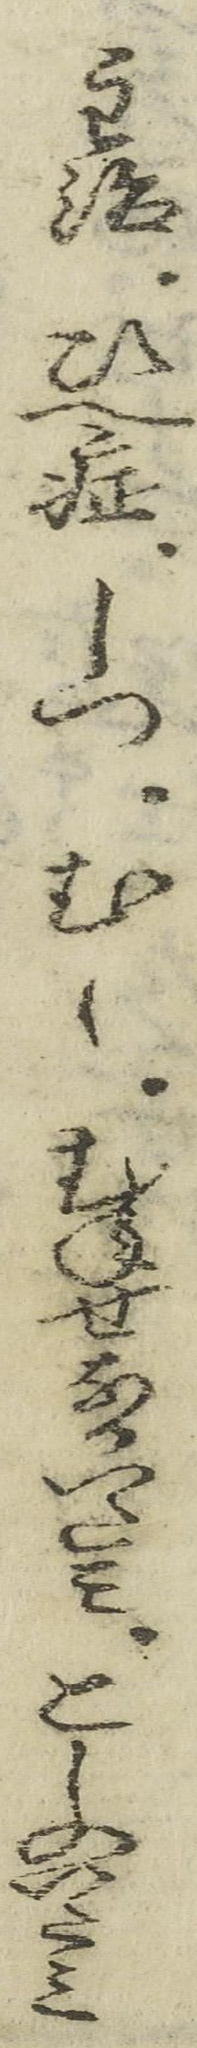主治・ひへ症・しつ・むし・むねせなかいたみ・こしのいたみ
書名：草津温泉　入湯案内記
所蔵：東京大学地震研究所図書室 Earthquake Research Institute Library, The University of Tokyo, JAPAN
